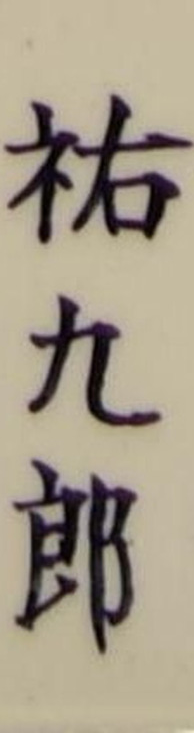祐九郎
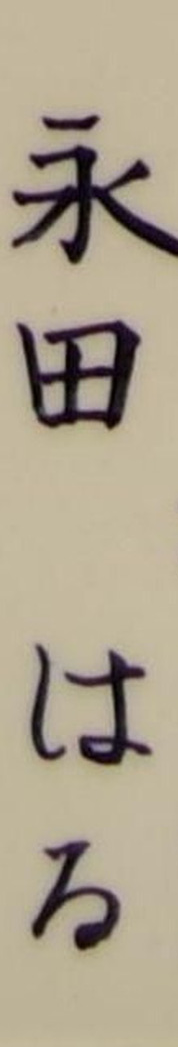永田はる
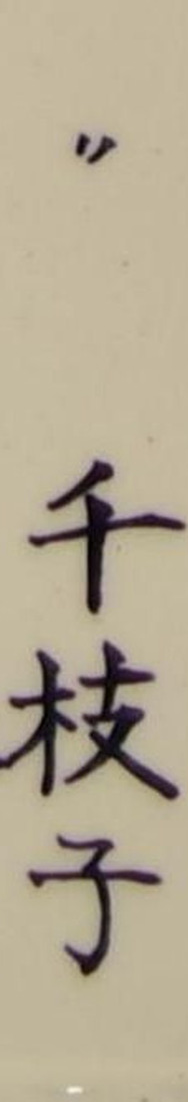千枝子
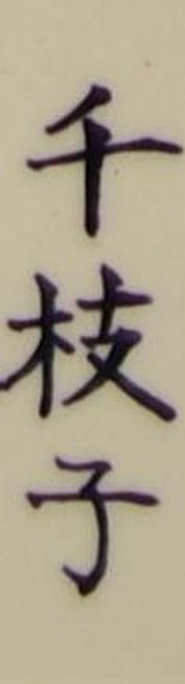千枝子
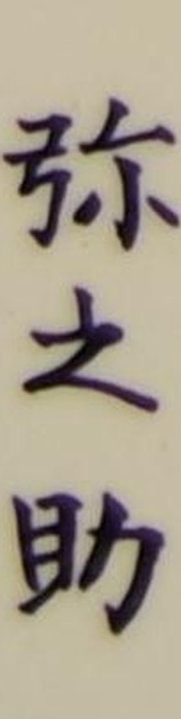弥之助
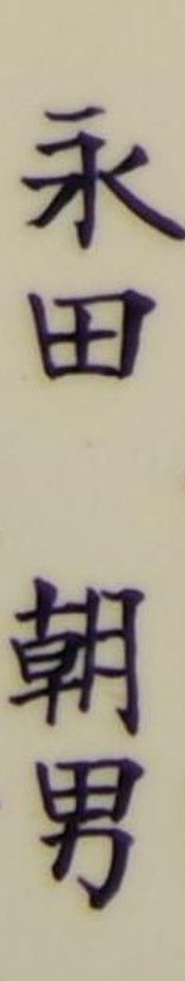永田朝男

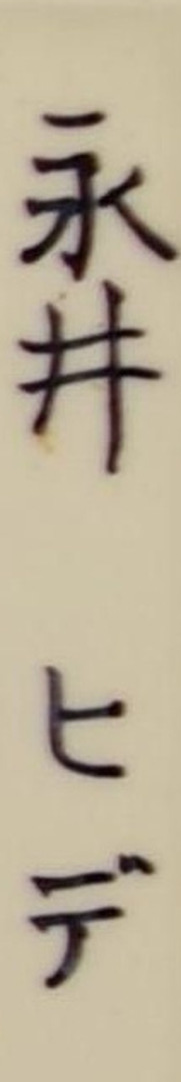永井ヒデ
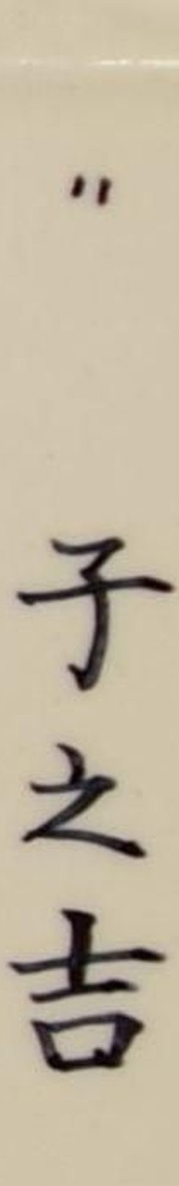子之吉
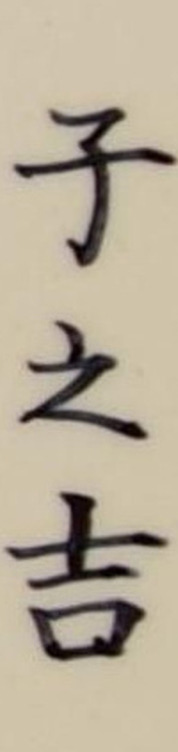子之吉
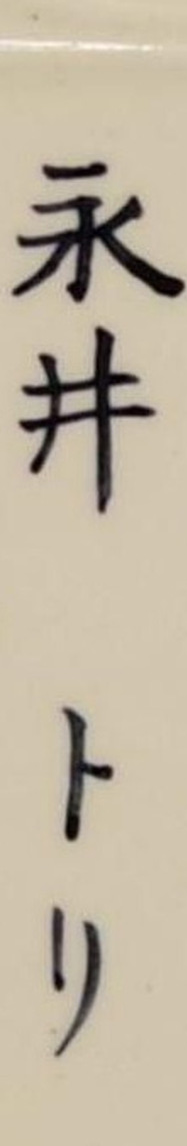永井トリ
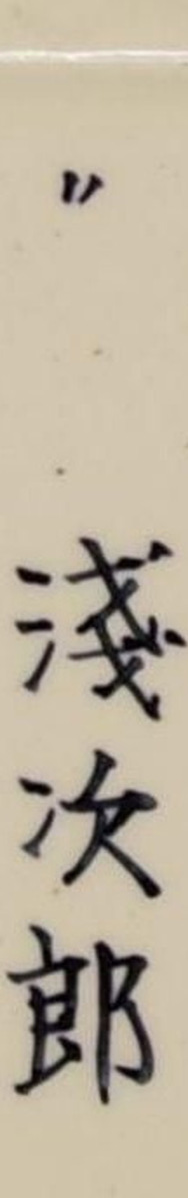浅次郎
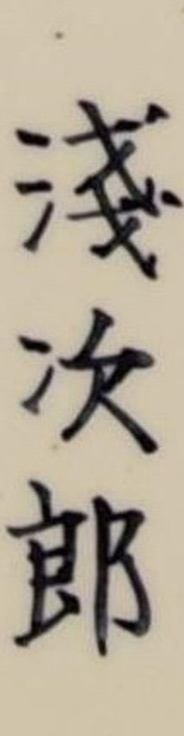浅次郎
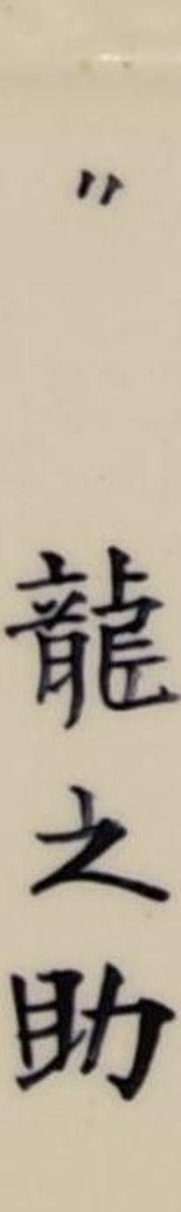龍之助
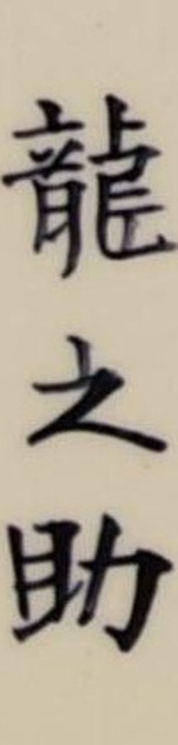龍之助
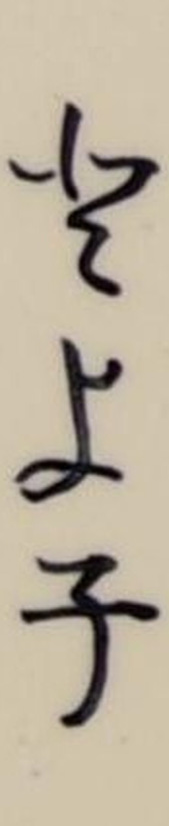とよ子
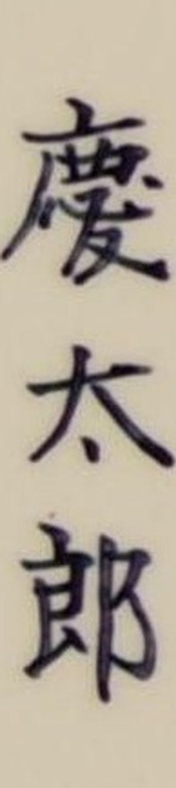慶太郎
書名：A~D
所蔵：koyasan kongobuji
